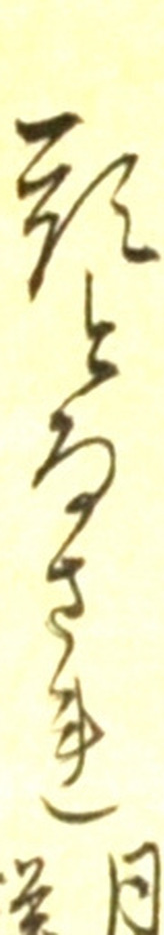頭となされ
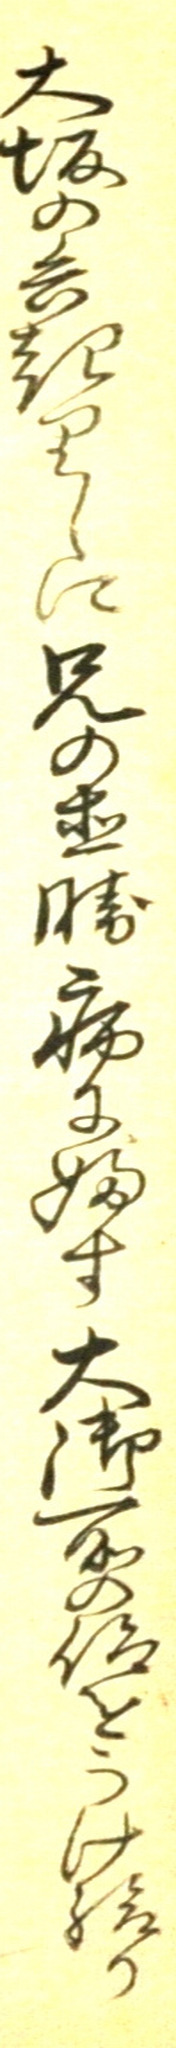大坂の兵起りしに兄の直勝病にふす大御所の仰をうけ給り
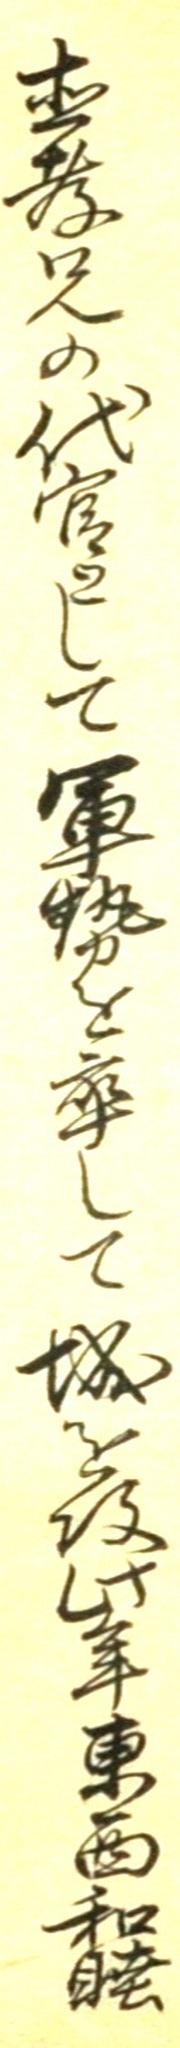直孝兄の代官として軍勢を率して城を攻此年東西和睦
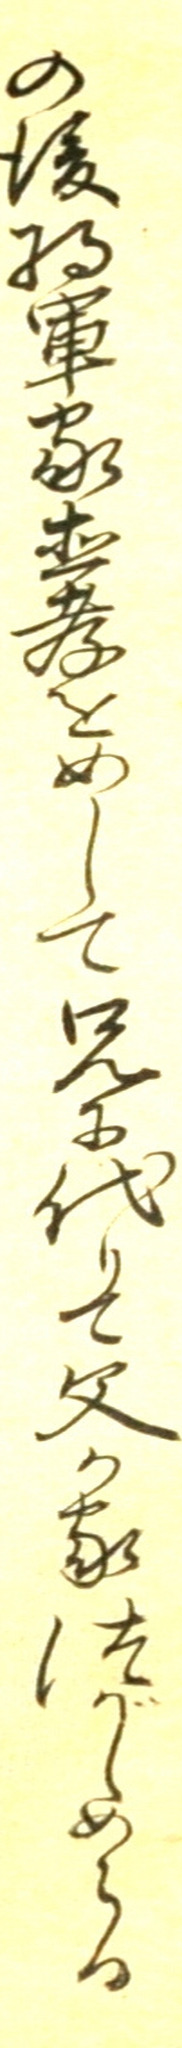の後将軍家直孝をめして兄に代りてち父の家つがしめらる

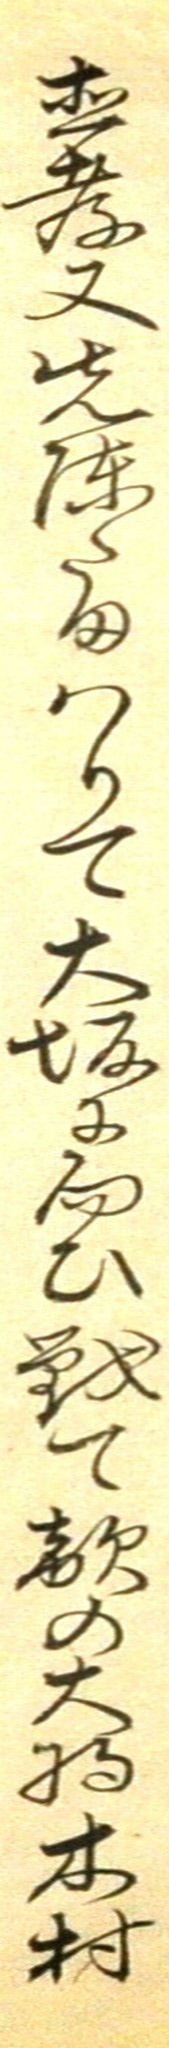直孝又先陣たまはりて大坂に向ひ戦て敵の大将木村
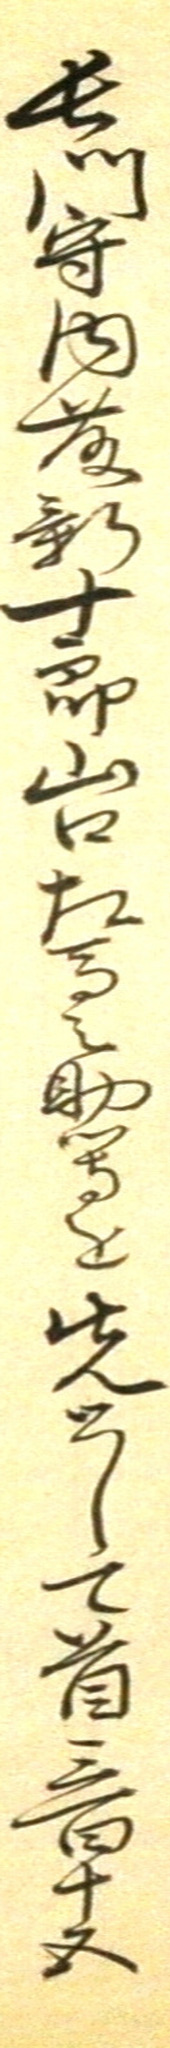長門守内藤新十郎山口左馬之助等を先として首三百十五
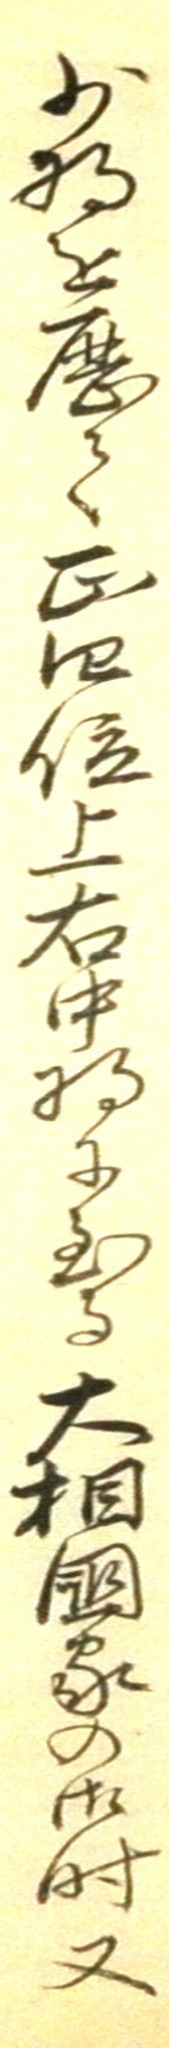少将を歴て正四位上右中将に至る大相国家の御時又
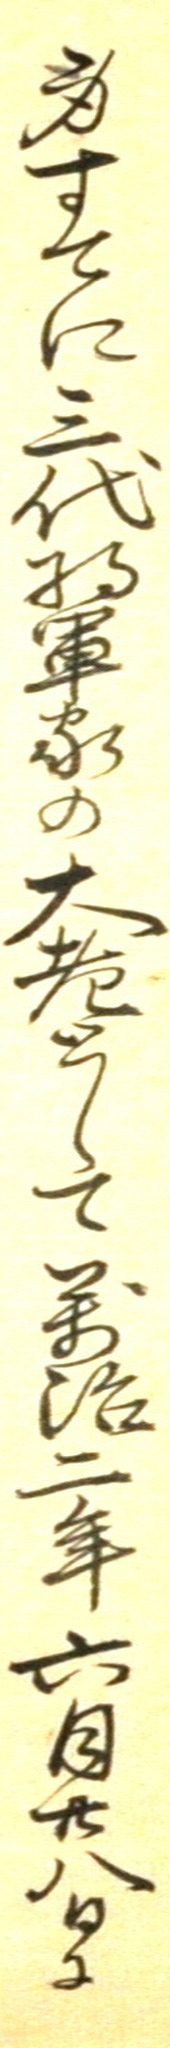身すてに三代将軍家の大老として万治二年六月廿八日に
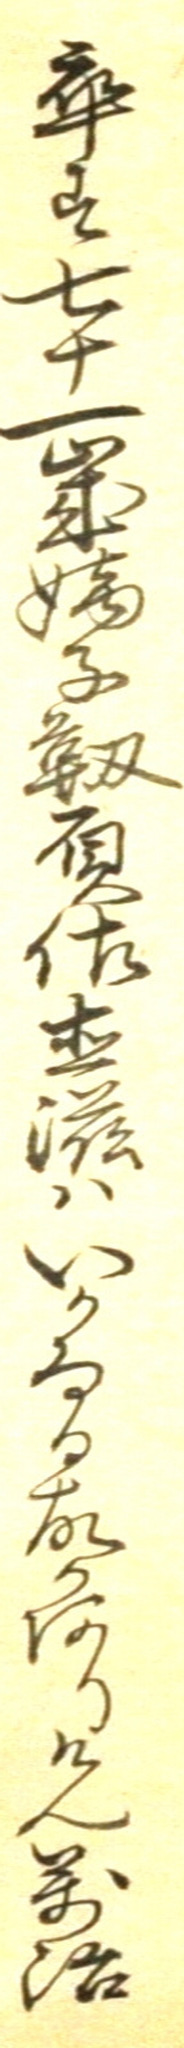卒す七十一歳嫡子靱負佐直滋はいかなる故かありけん万治
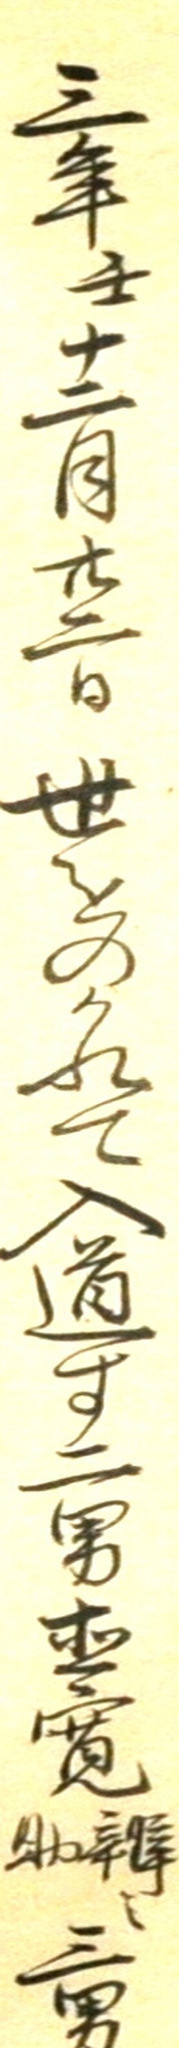三年壬十二月廿二日世をのかれて入道す二男直寛弁之助三男
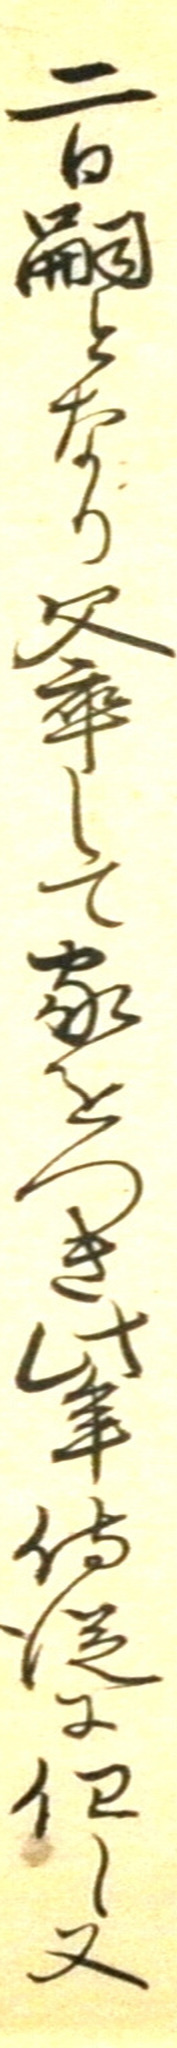二日嗣となり父卒して家をつき此年侍従に任し又
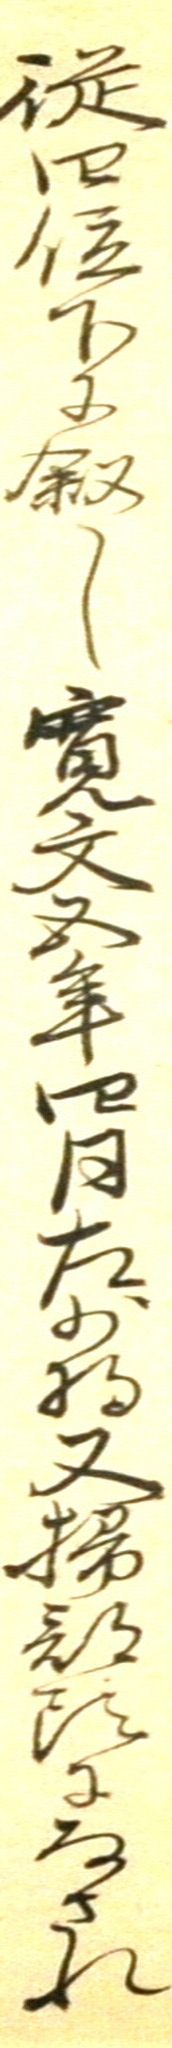従四位下に叙し寛文五年四月左少将又掃部頭になされ
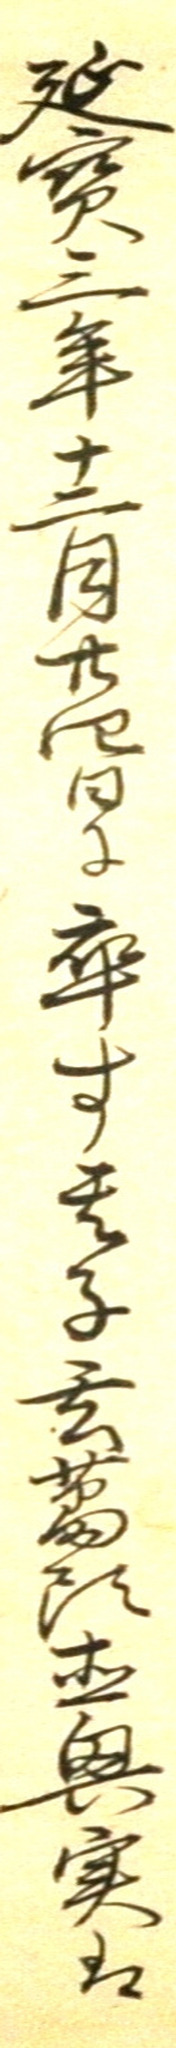延宝三年十二月廿四日に卒す其子玄蕃頭直興実は
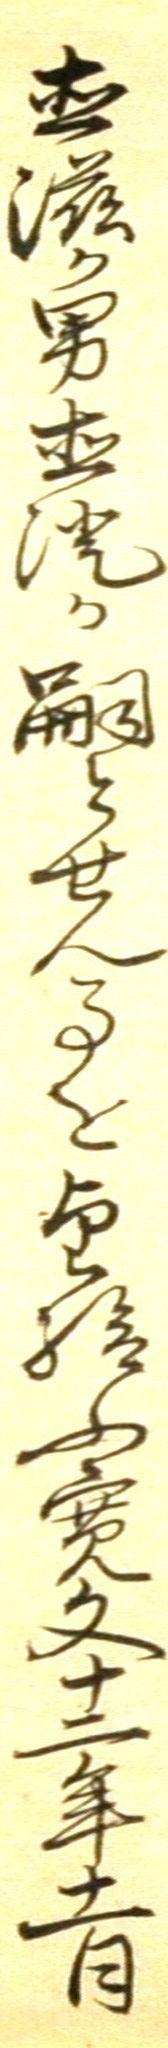直滋か男直澄か嗣とせん事を望給ふ寛文十二年十一月
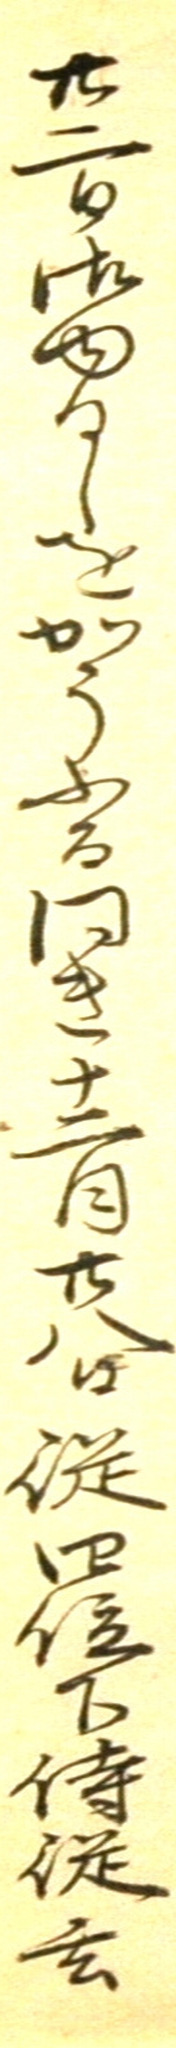廿二日御ゆるしをかうふる同き十二月廿八日従四位下侍従玄
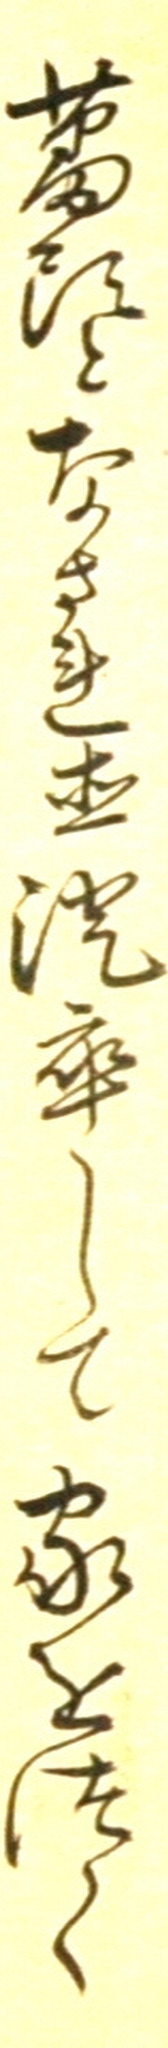蕃頭となされ直澄卒して家をつく
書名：藩翰譜（四・上）
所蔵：伊那市立高遠町図書館・合同会社AMANE
